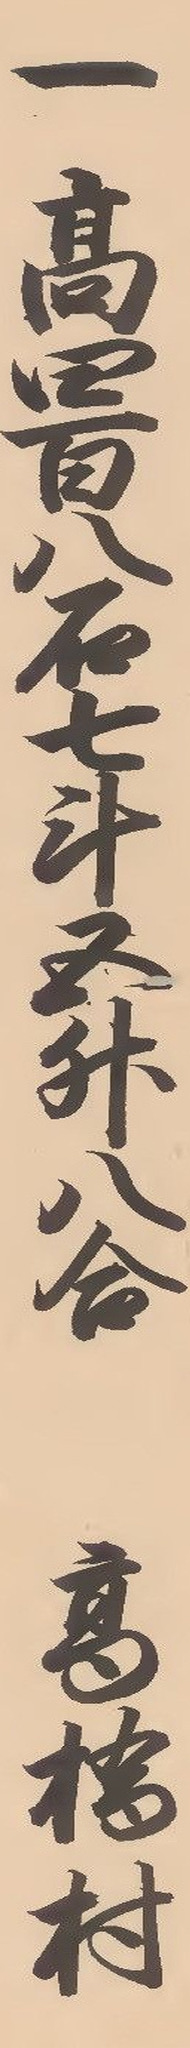一高四百八石七斗五升八合高橋村
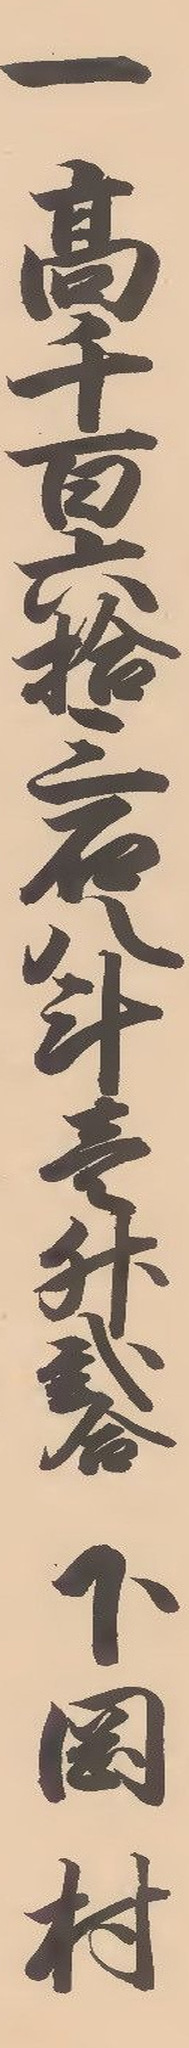一高千百六拾三石八斗壱升弐合下岡村
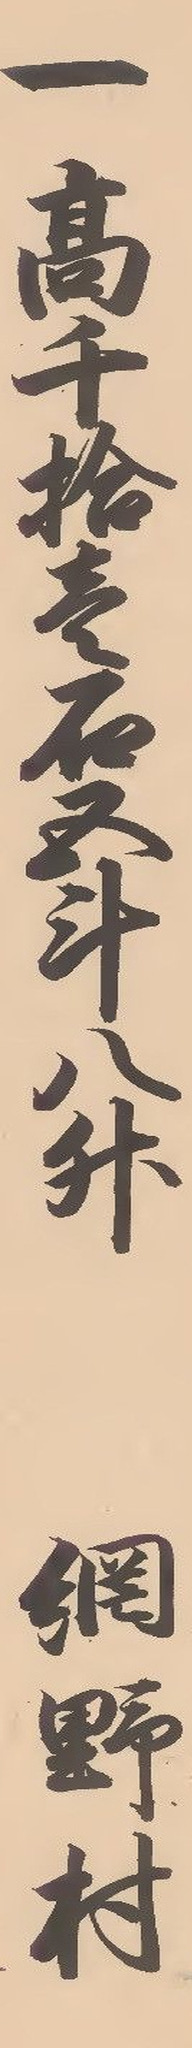一高千拾壱石五斗八升網野村

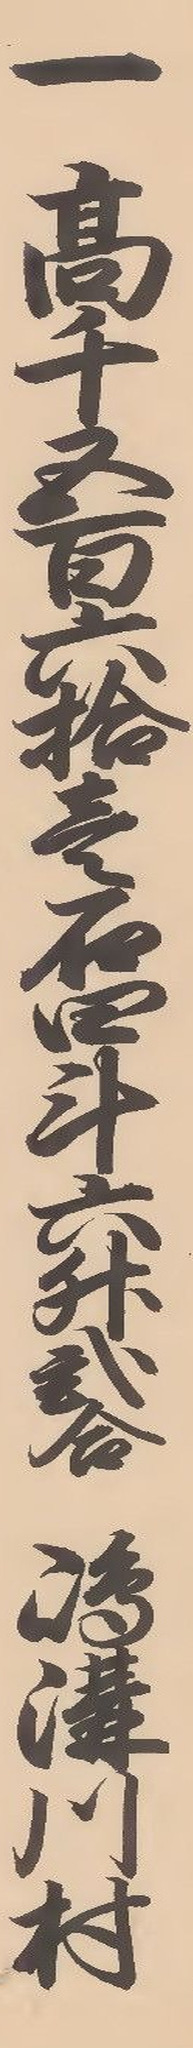一高千五百六拾壱石四斗六升弐合島溝川村
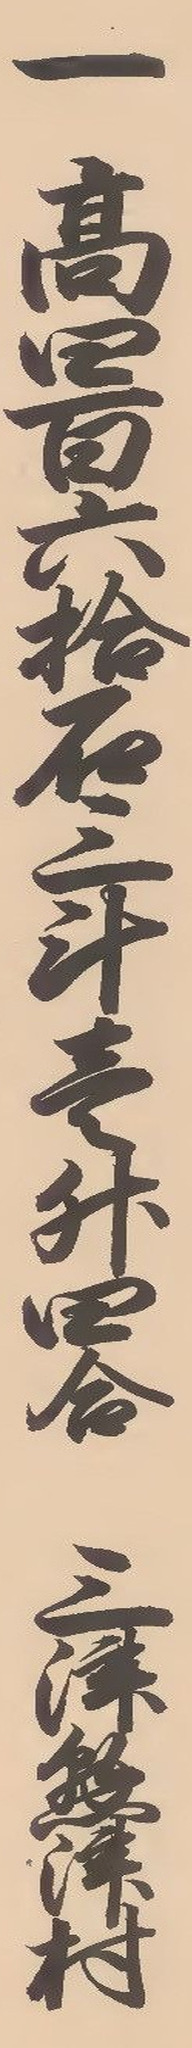一高四百六拾石三斗壱升四合三津懸津村
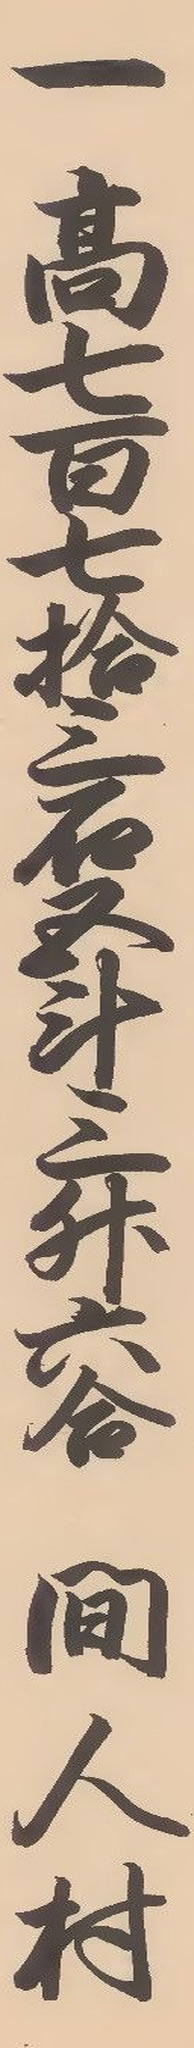一高七百七拾三石五斗三升六合間人村
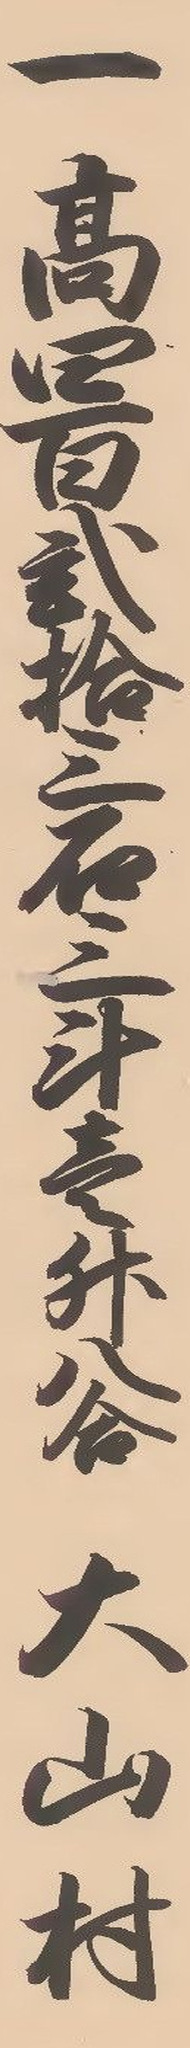一高四百弐拾三石三斗壱升八合大山村
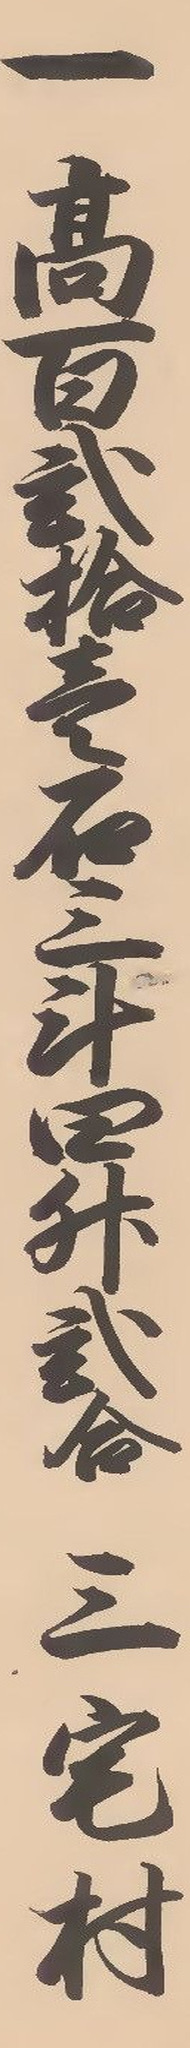一高百弐拾壱石三斗四升弐合三宅村
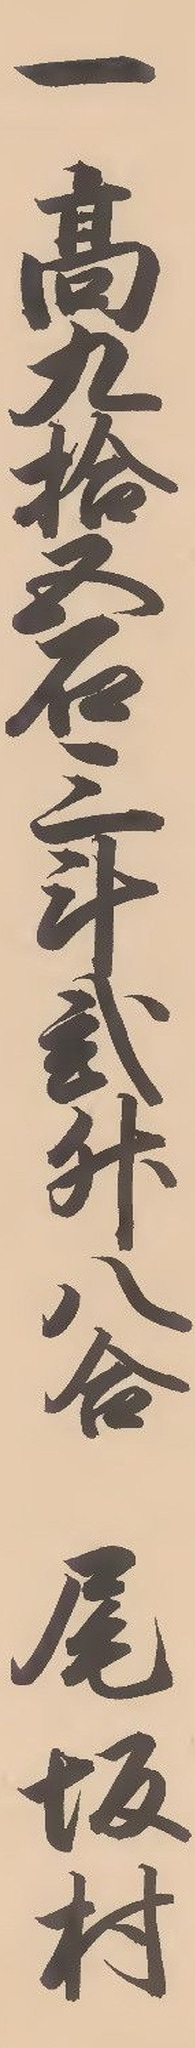一高九拾五石三斗弐升八合尾坂村
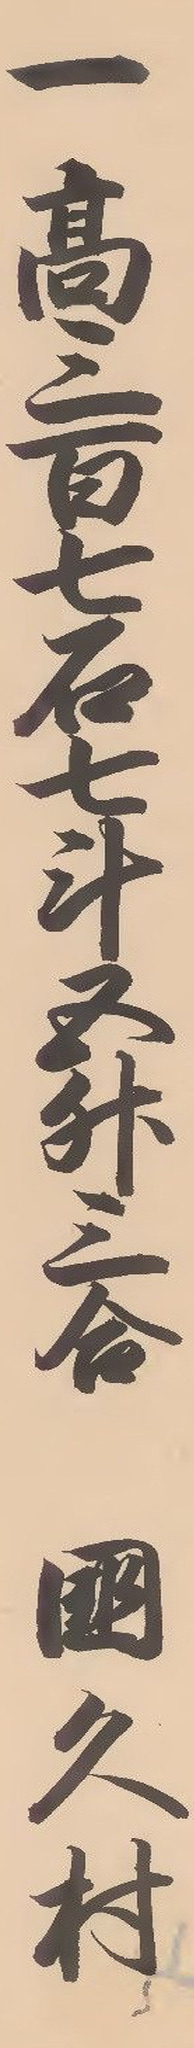一高三百七石七斗五升三合国久村

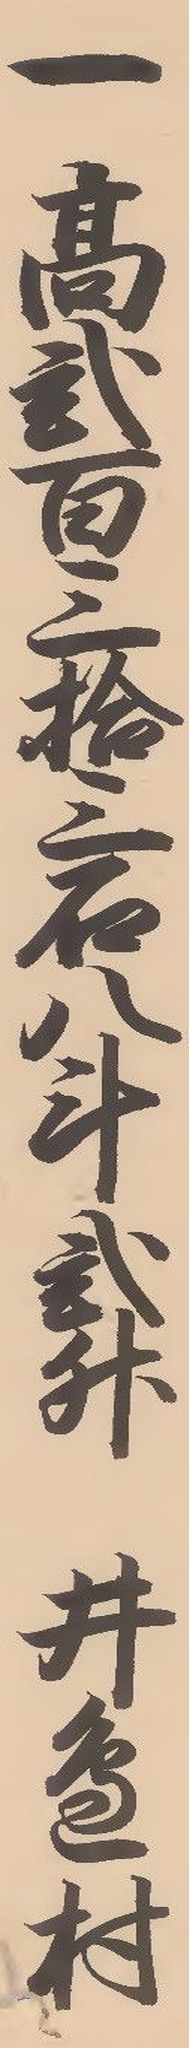一高弐百三拾三石八斗弐升井辺村
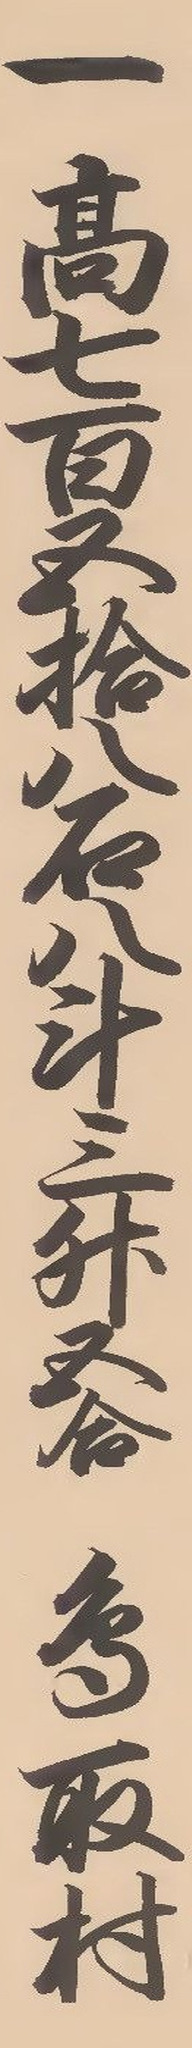一高七百五拾八石八斗三升五合鳥取村
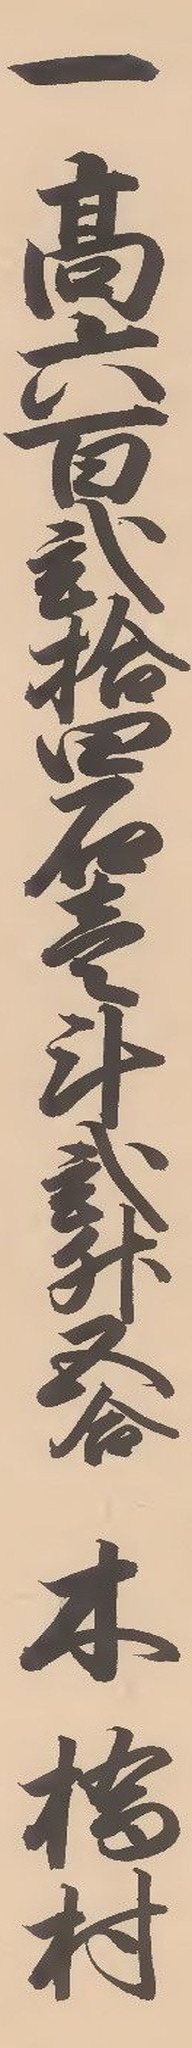一高六百弐拾四石壱斗弐升五合木橋村
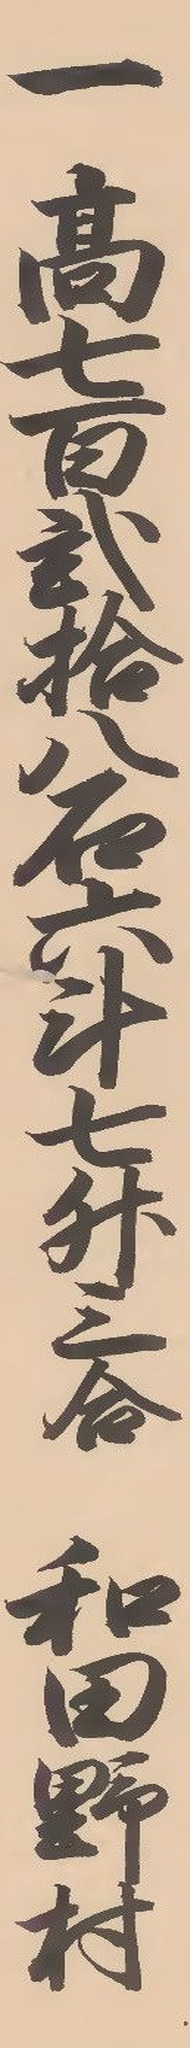一高七百弐拾八石六斗七升三合和田野村
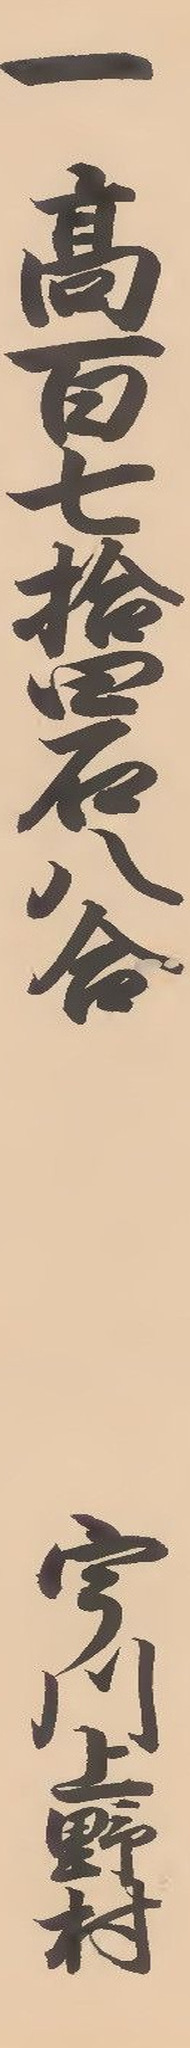一高百七拾四石八合宇川上野村

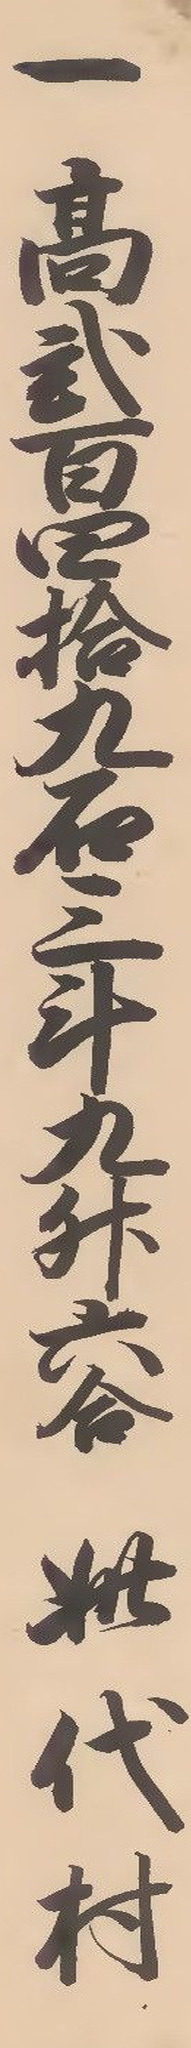一高弐百四拾九石三斗九升六合此代村
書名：丹後国郷帳
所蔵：国立公文書館 National Archives of Japan
